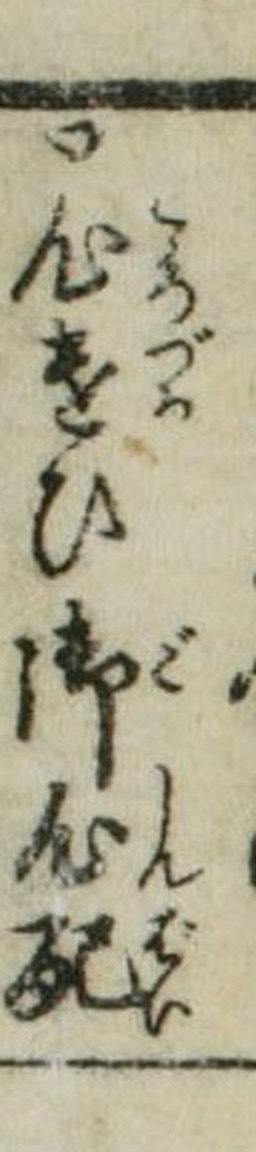御心遣ひ御心配
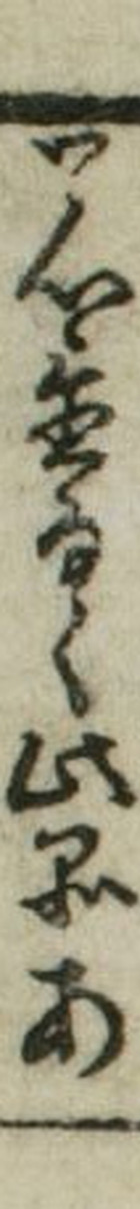御心置なく此品あ
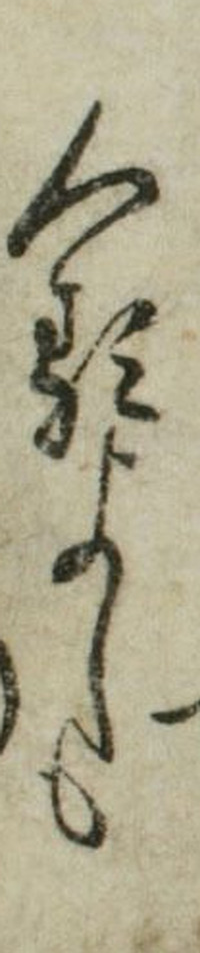くるよしも

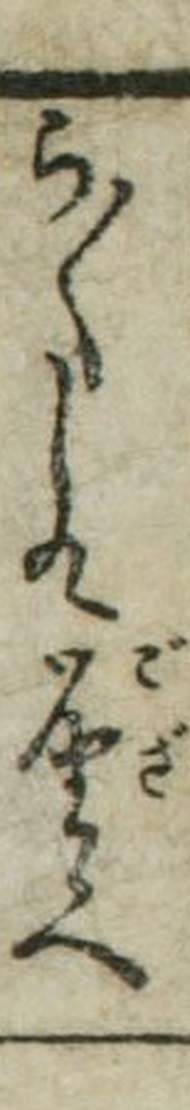ら〳〵しく御座候へ
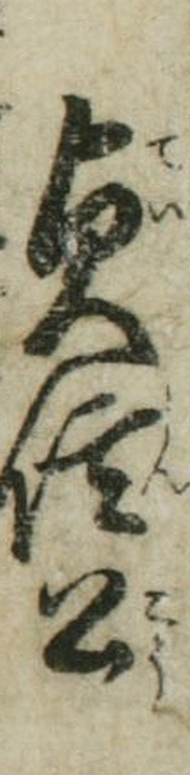貞信公
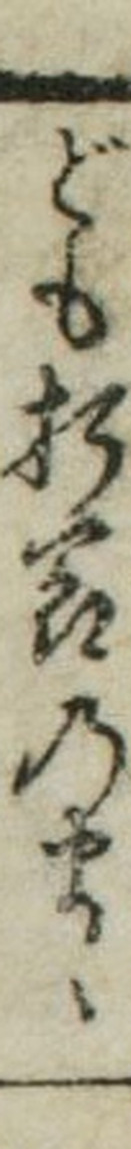ども折節のまゝ
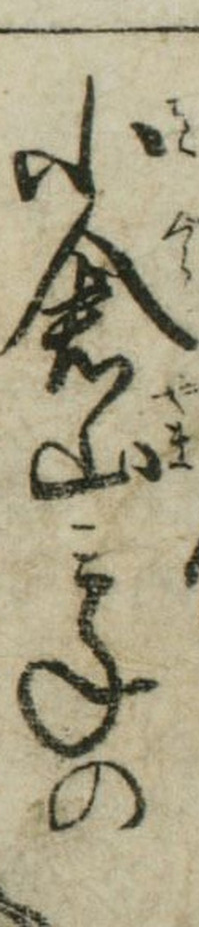小倉山みねの
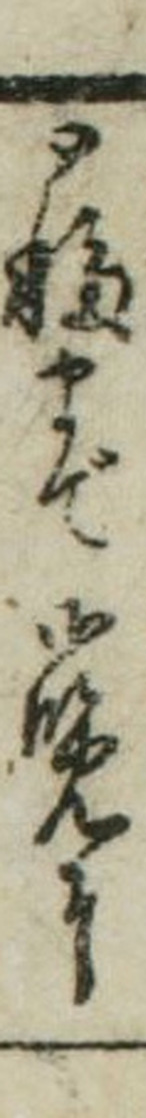御移まで御覧に
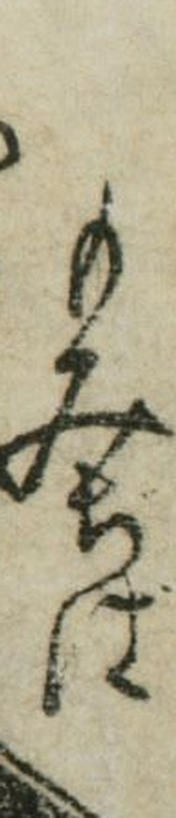もみぢば
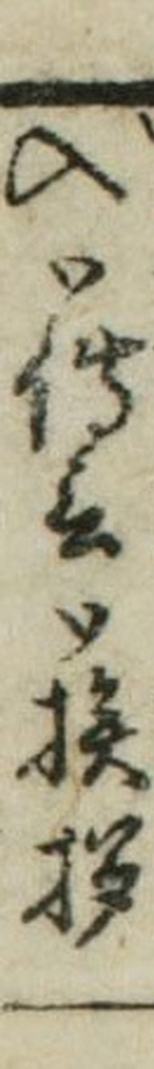入御伝言御挨拶
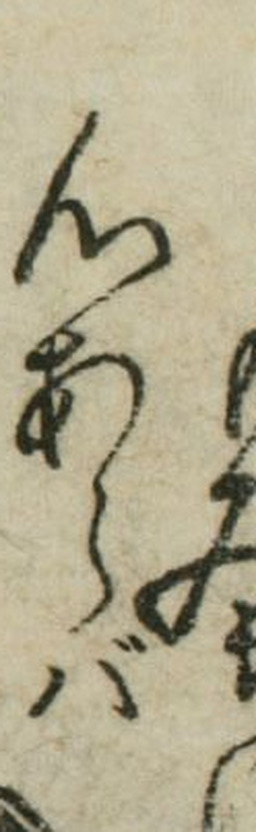心あらば
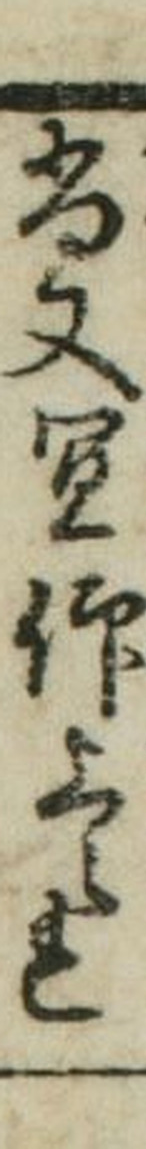尚又宜仰上られ
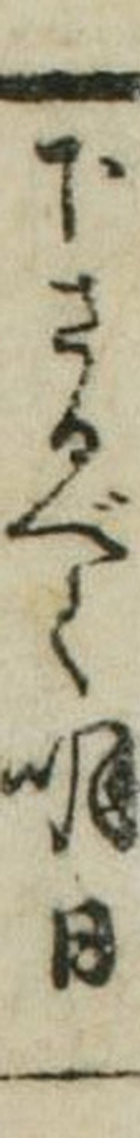下さるべく明日
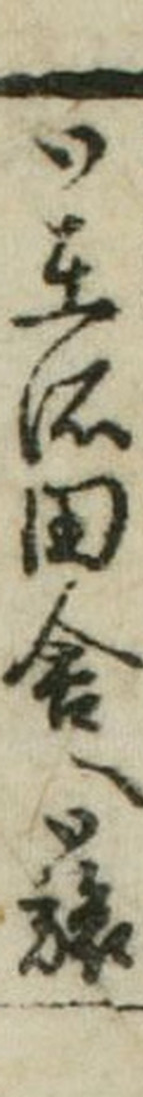御在所田舎へ御旅
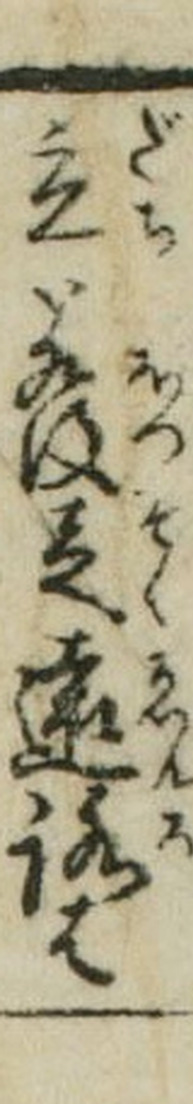立御発足遠路は
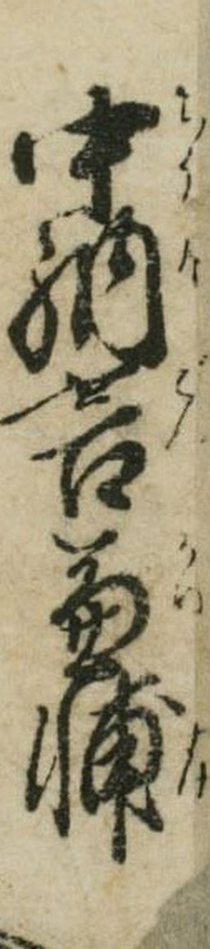中納言兼輔
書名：百人一首
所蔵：東京学芸大学教育コンテンツアーカイブ
